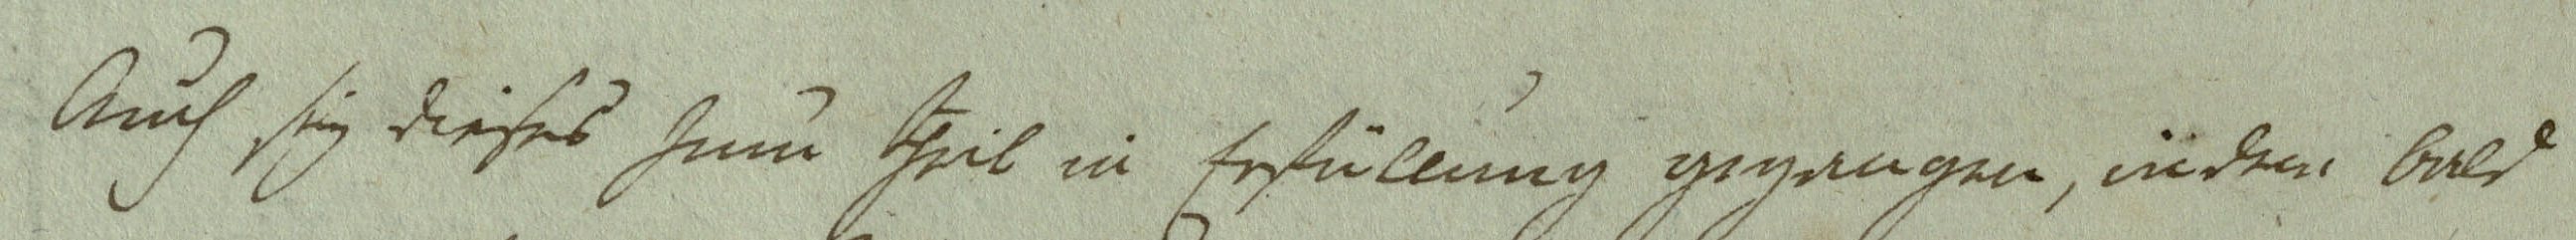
Auch seÿ dieses zum Theil in Erfüllung gegangen, indem bald
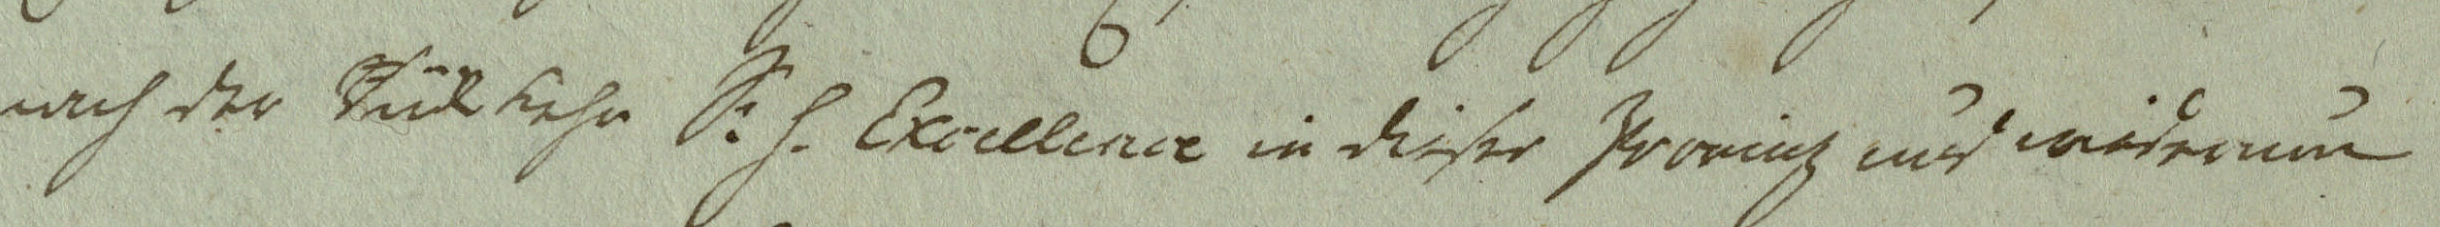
nach der Rückkehr Sr. h. Excellence in dieser Provinz und wiederum
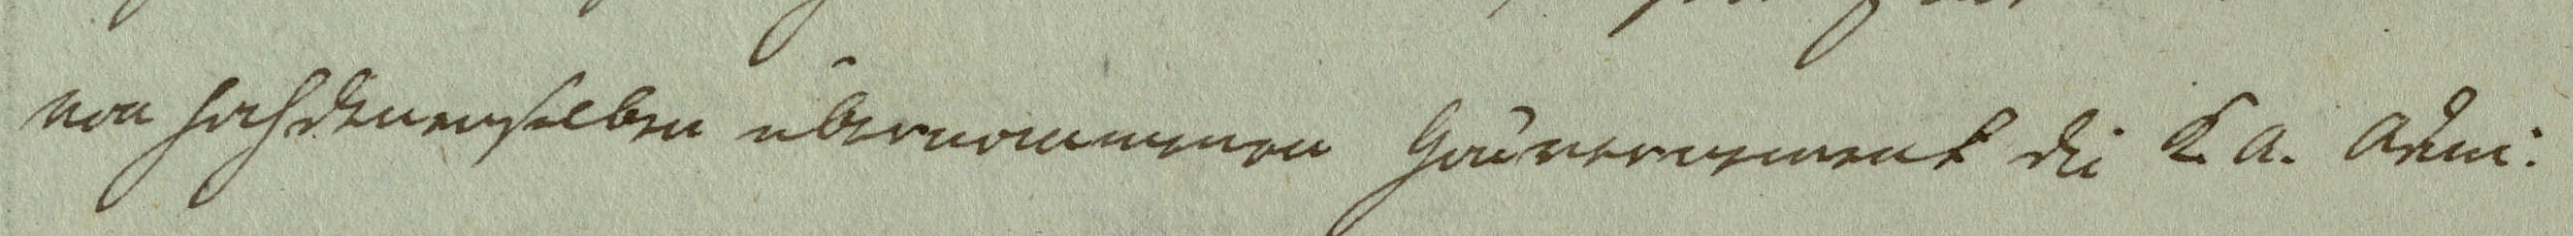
von hochdenenselben übernommenen Gouvernement die K. A. Admi¬
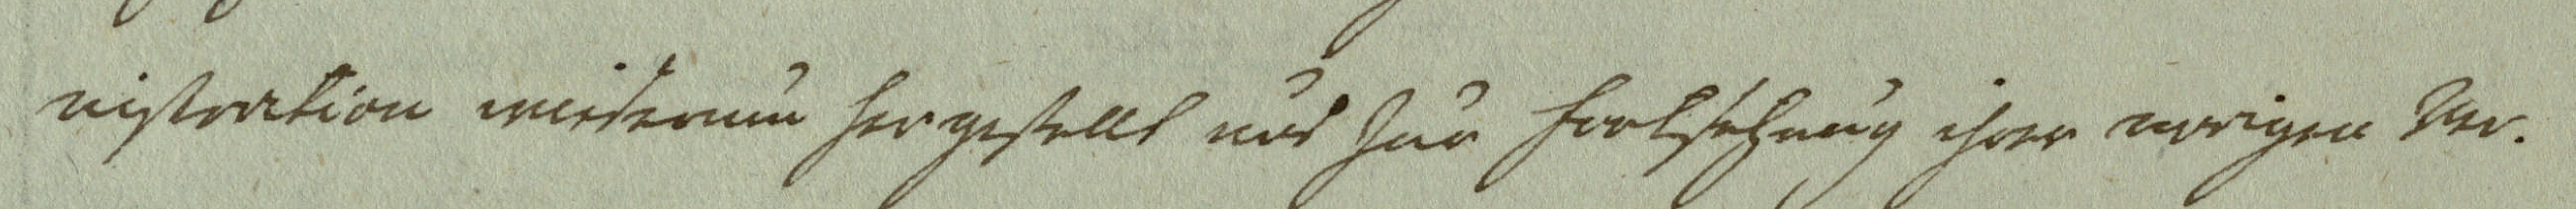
nistration wiederum hergestellt und zur Fortsetzung ihrer vorigen Ver¬
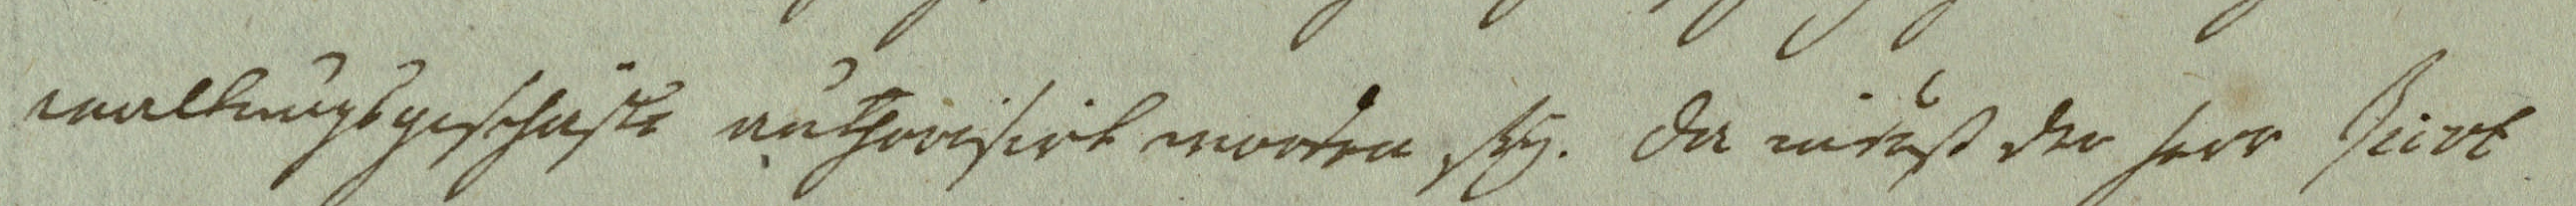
waltungsgeschäfte authorisirt worden seÿ. Da indeß der herr Ricot
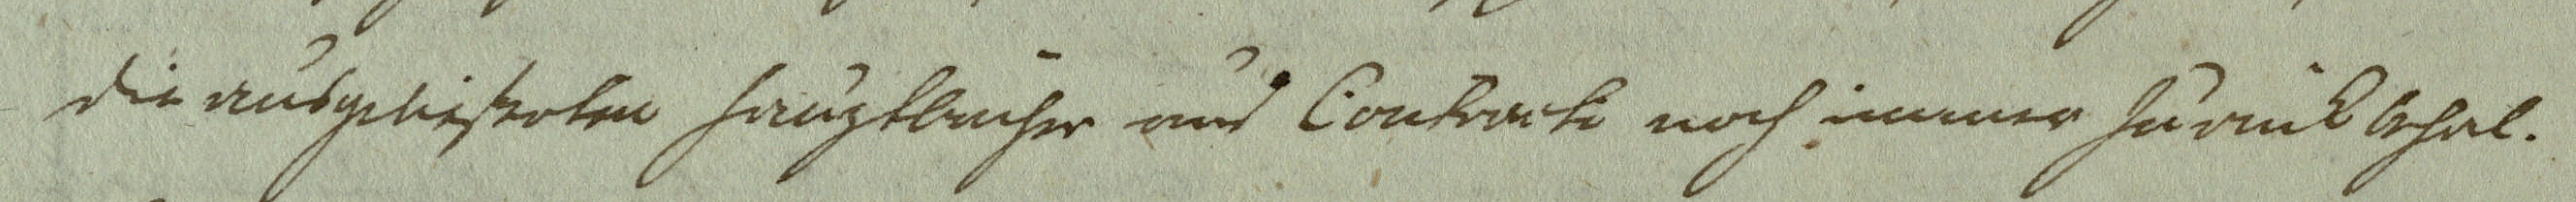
die ausgelieferten Hauptbücher und Contracte noch immer zurückbehal¬
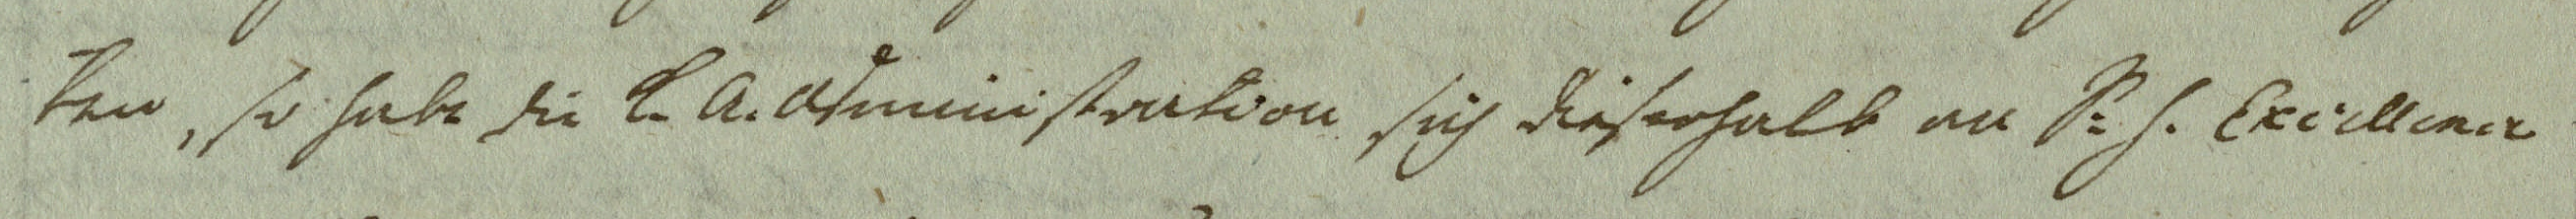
ten, so habe die K. A. Administration sich dieserhalb an Sr. h. Excellence
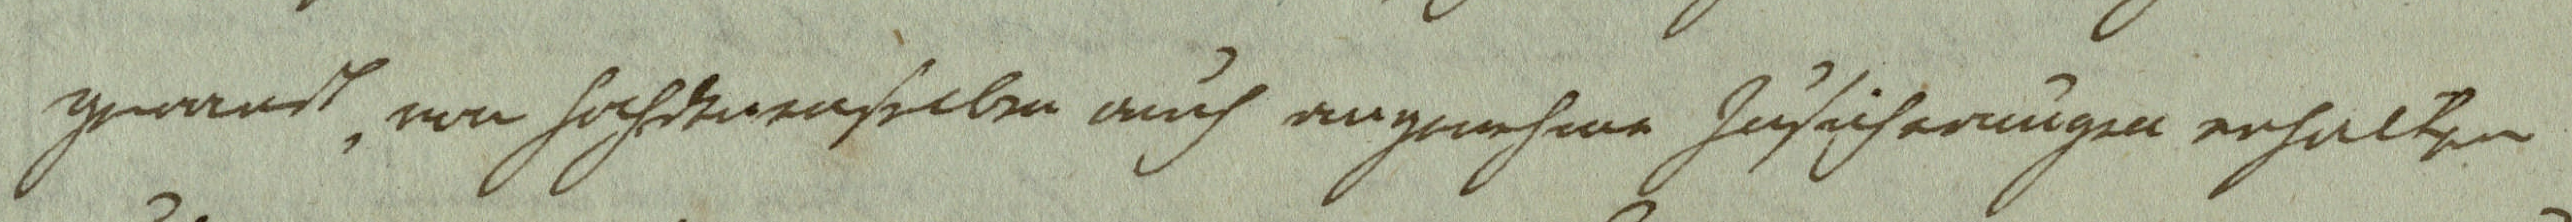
gewandt, von hochdenensleben auch angenehme Zusicherungen erhalten
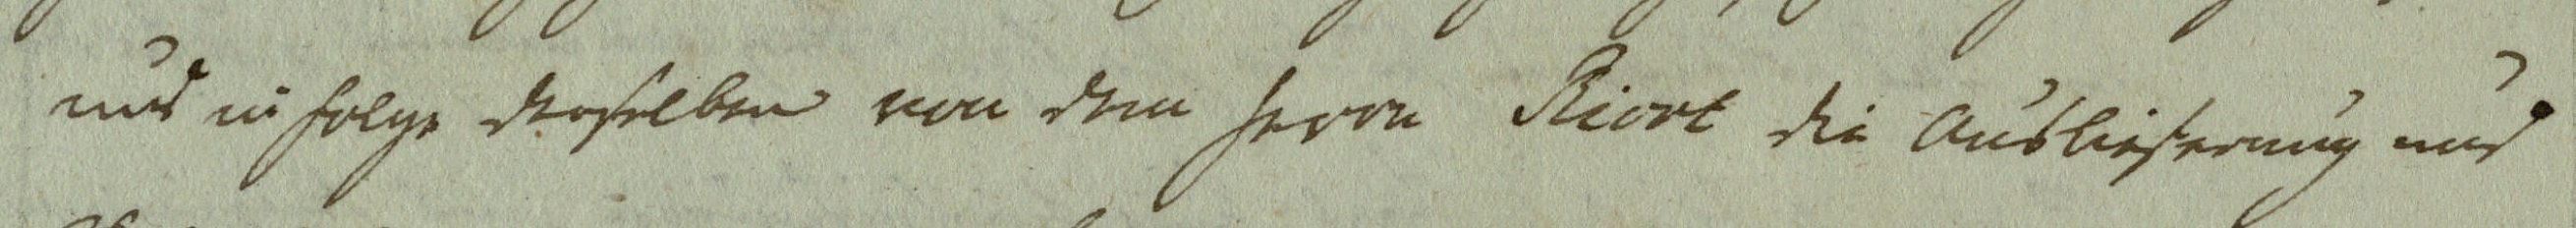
und in Folge derselben von dem herrn Ricot die Auslieferung und
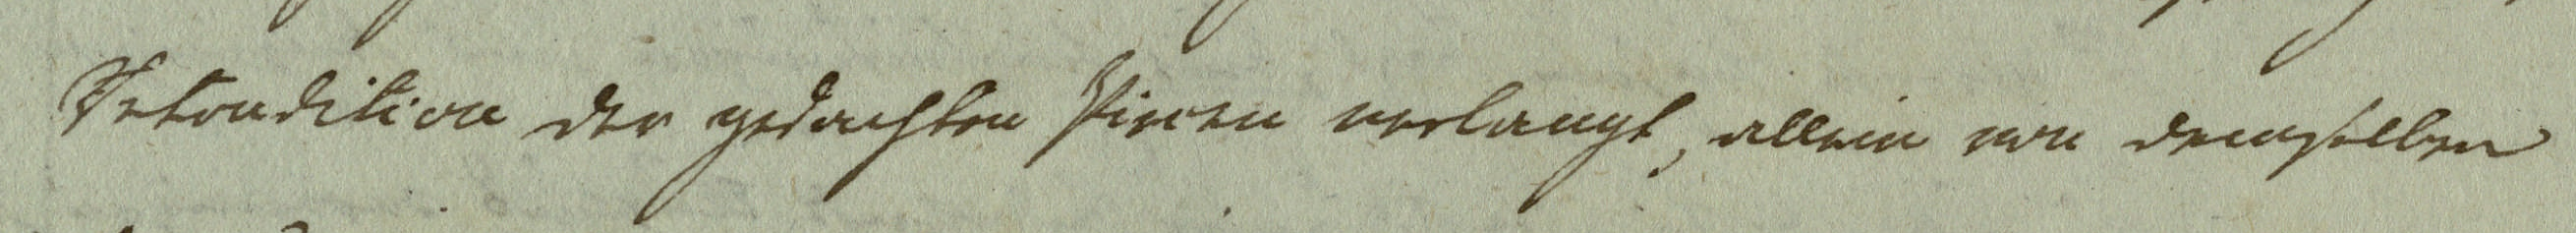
Retradition der gedachten Piecen verlangt, allein von demselben
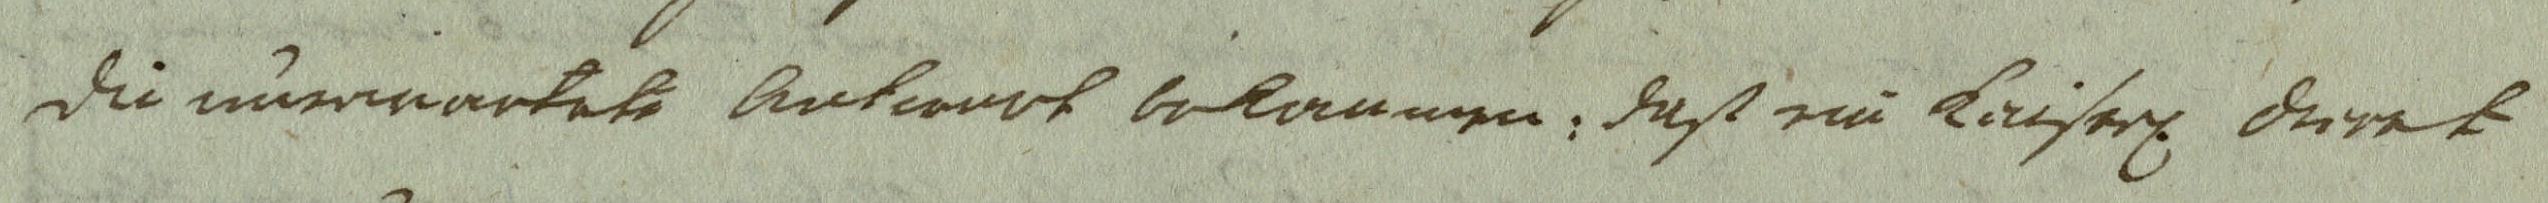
die unerwartete Antwort bekommen, daß ein Kaiserl. Decret
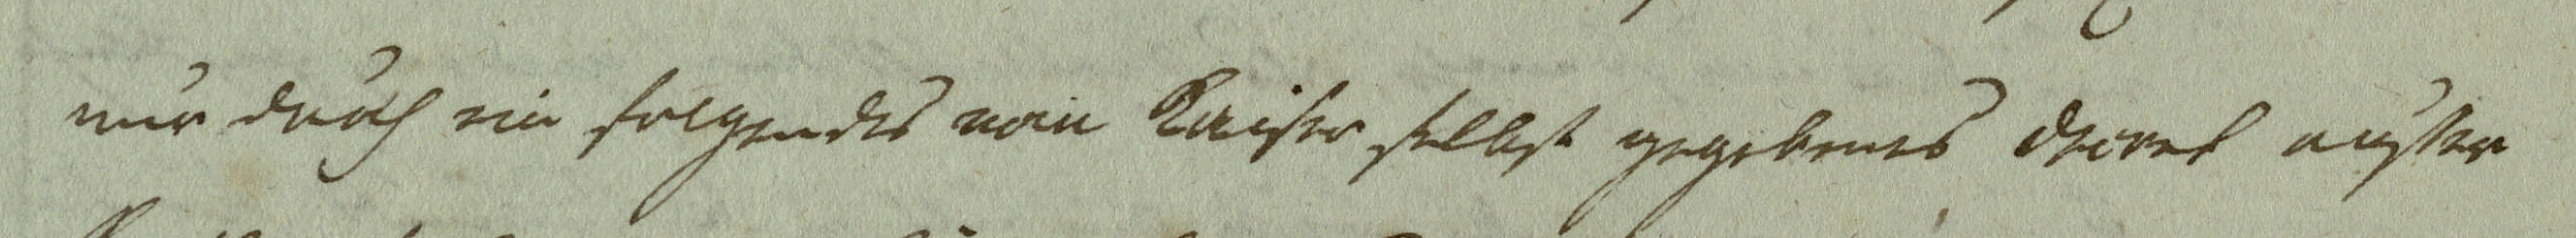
nur durch ein folgendes vom Kaiser selbst gegebenes Decret außer
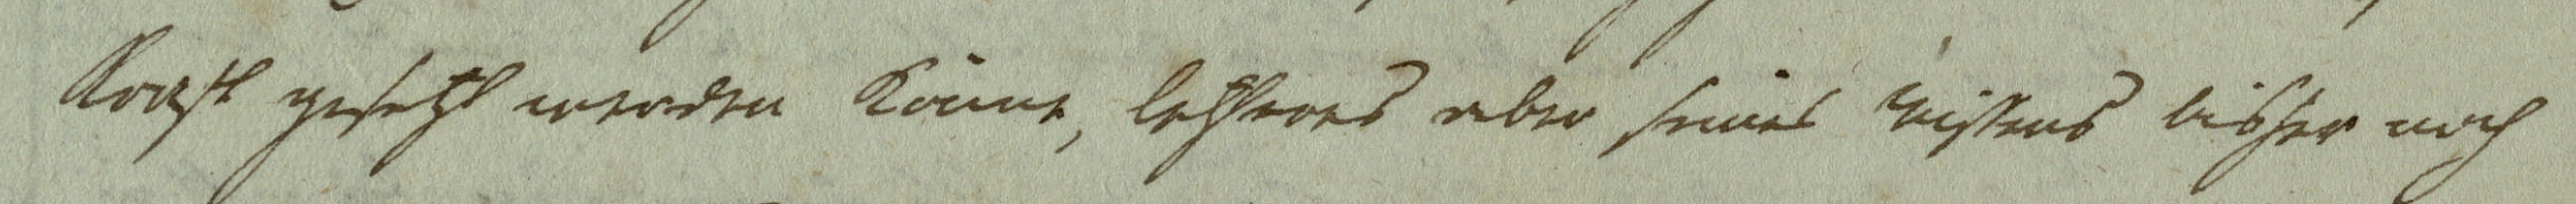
Kraft gesetzt werden könne, letzteres aber seines Wissens bisher noch
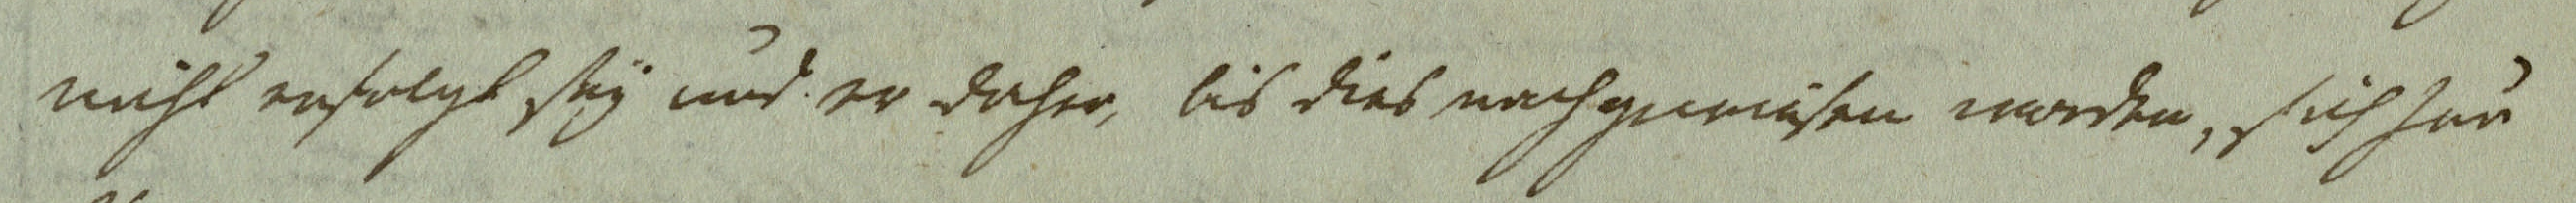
nicht erfolgt seÿ und er daher, bis dies nachgewiesen worden, sich zur
